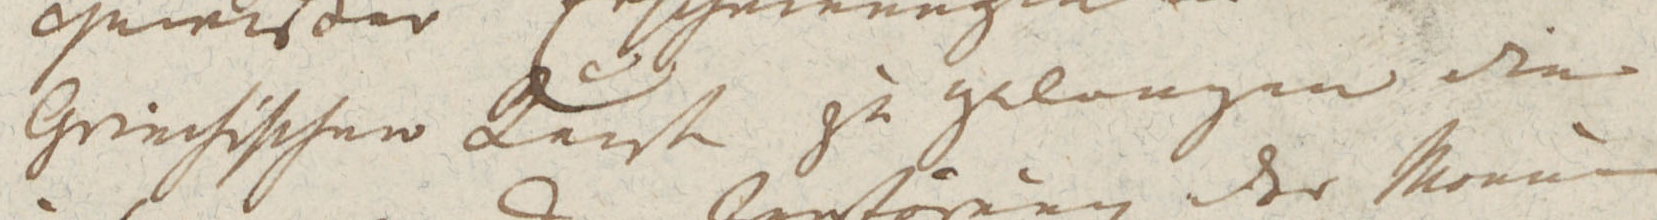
Griechischen Kunst zu gelangen die
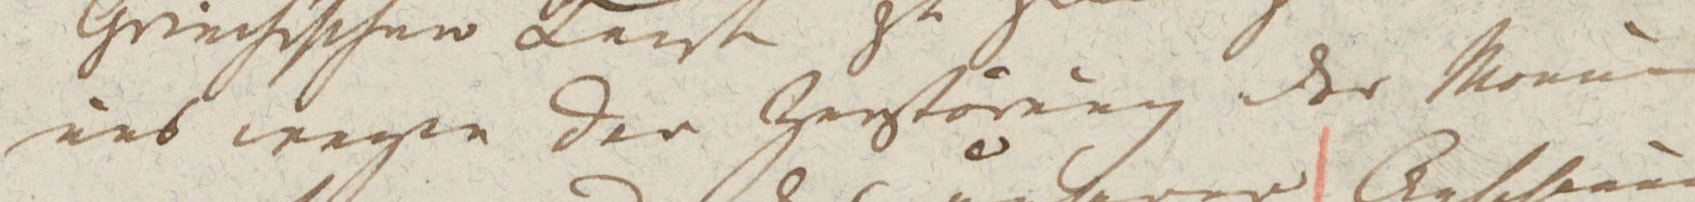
uns wegen der Zerstörung der Monu-
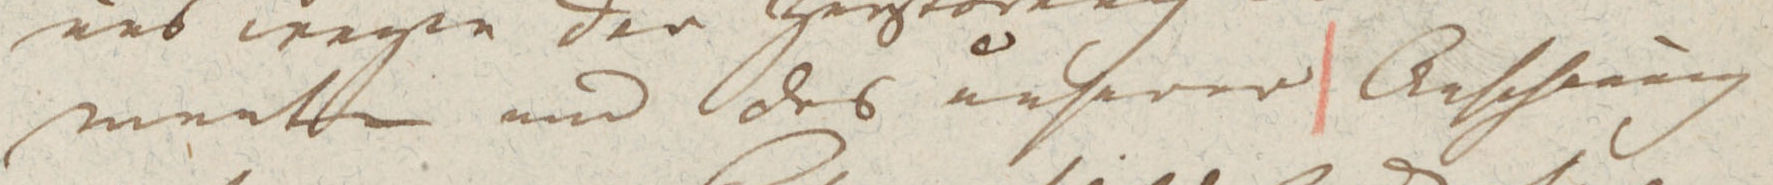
mente und des unserer % Anschauung
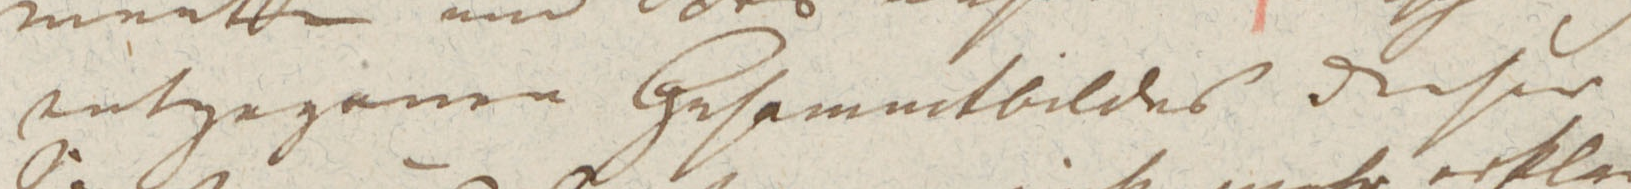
entzogenen Gesammtbildes dieser
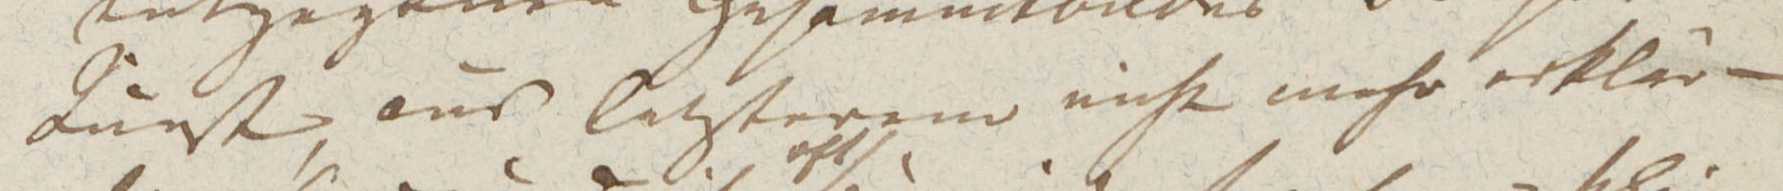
Kunst, aus letzterem nicht mehr erklär-
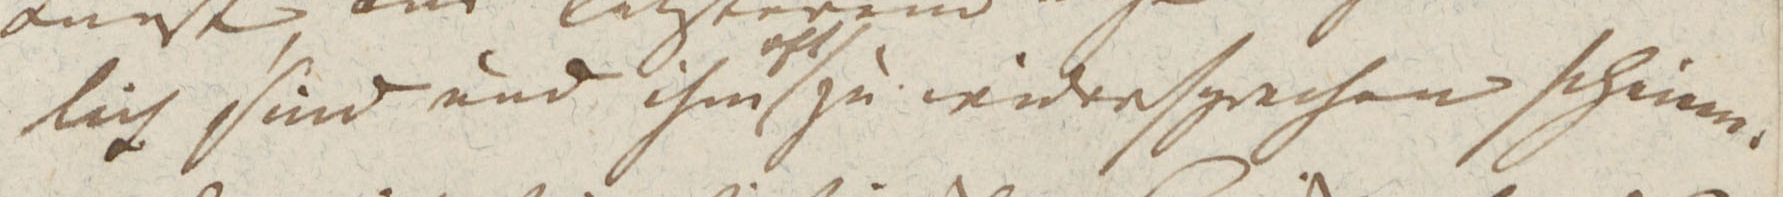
lich sind und ihm oft zu widersprechen scheinen.
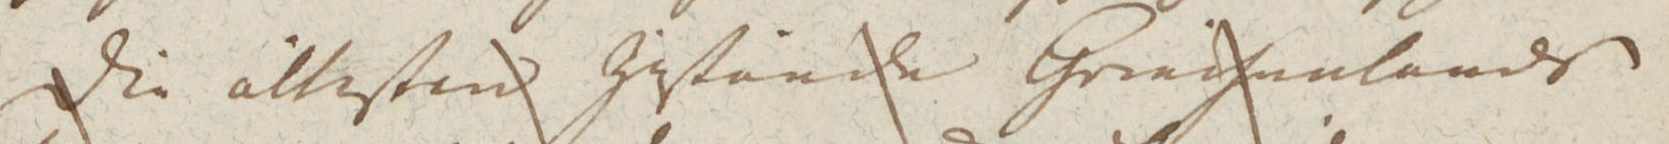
Die ältesten Zustände Griechenlands
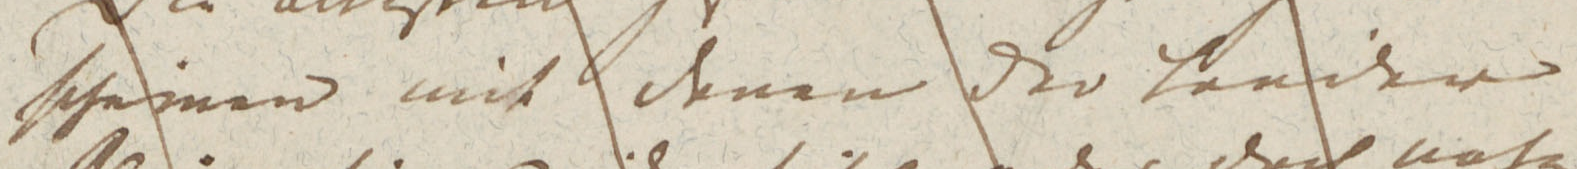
scheinen mit denen der Länder
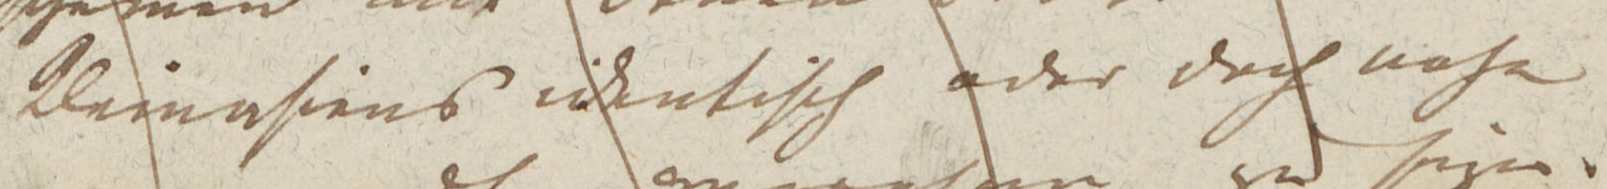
Kleinasiens identisch oder doch nahe
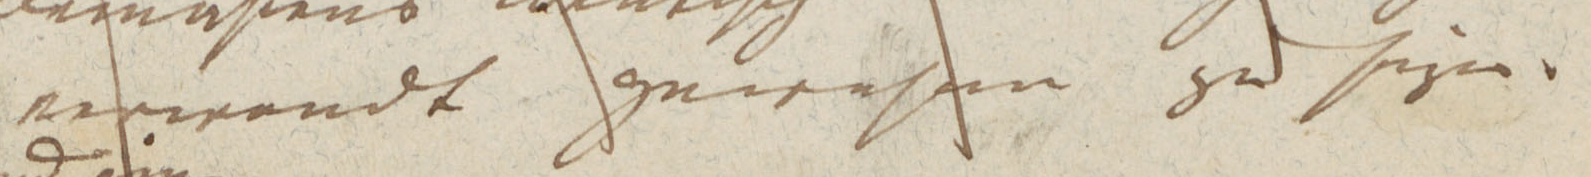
verwandt gewesen zu seyn.
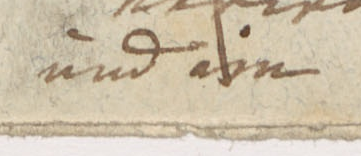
ein naher
